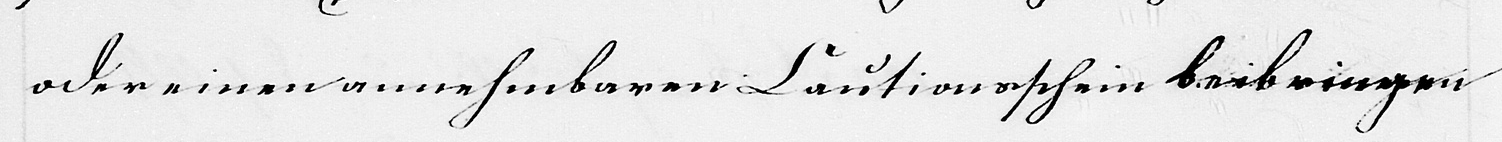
oder einen annehmbaren Cautionsschein beibringen
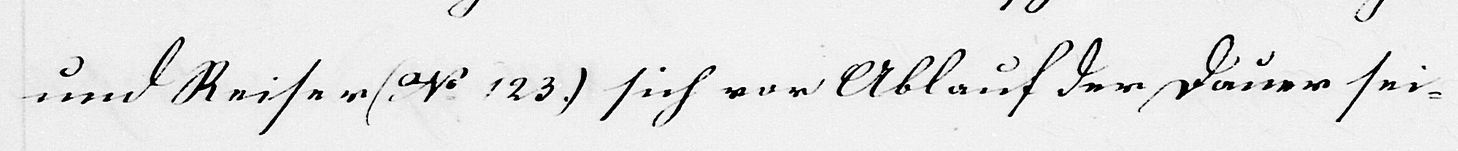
und Reiser (No 123.) sich vor Ablauf der Dauer sei¬
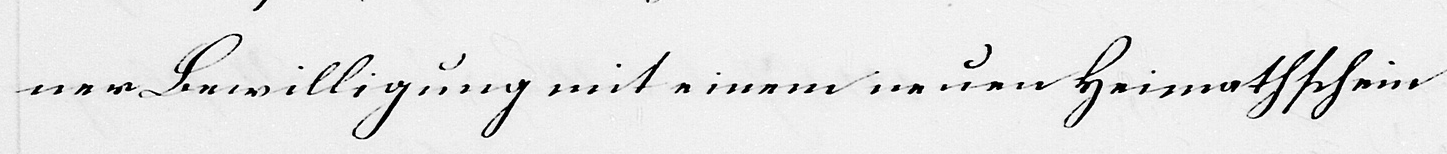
ner Bewilligung mit einem neuen Heimathschein
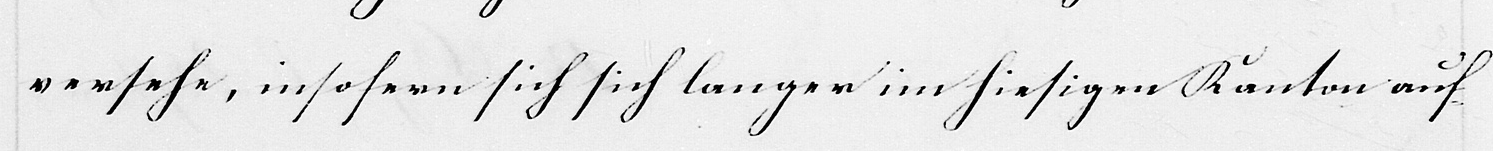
versehe, insofern sich sich [sic!] langer im hiesigen Kanton auf¬
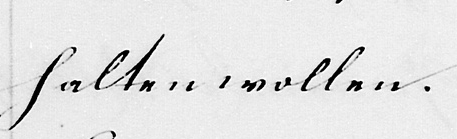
halten wollen.
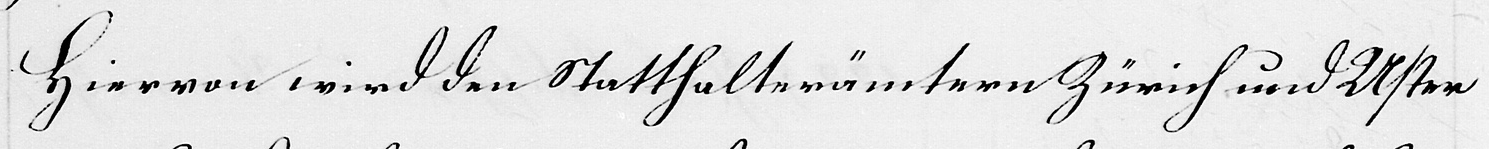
Hiervon wird den Statthalterämtern Zürich und Uster
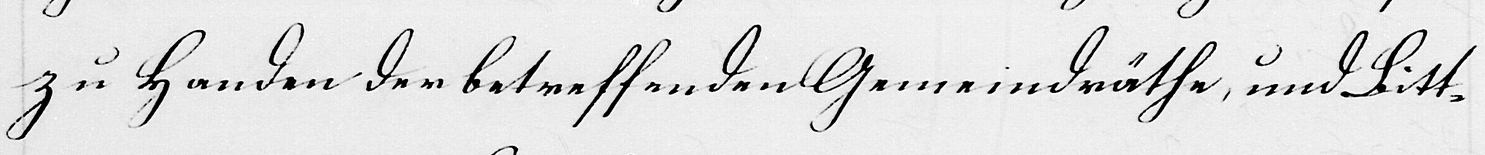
zu Handen der betreffenden Gemeindräthe, und Bitt¬
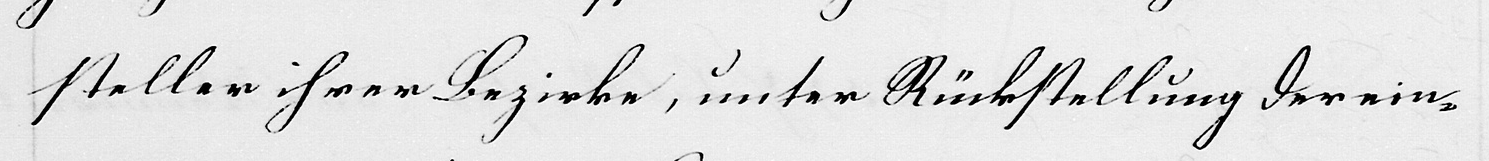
steller ihrer Bezirke, unter Rückstellung der ein¬
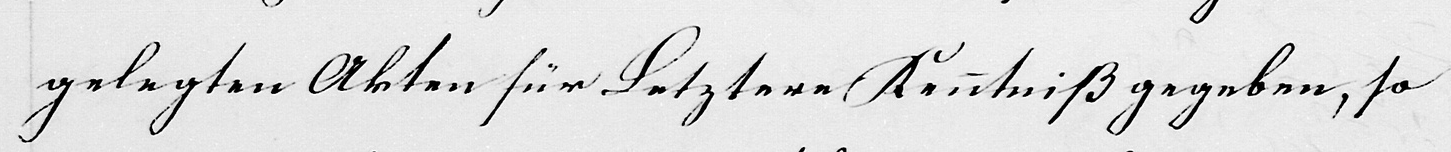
gelegten Akten für Letztere Kenntniß gegeben, so
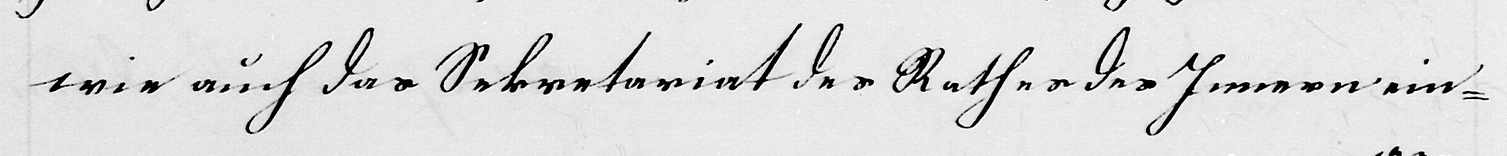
wie auch das Sekretariat des Rathes des Innern ein-
